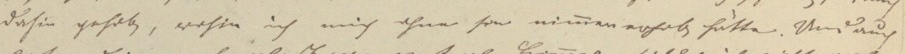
dahin gehoben, wohin ich mich ohne sie nimmer erhoben hätte. Und auch
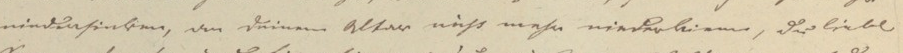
niedersinken, an Deinem Altar nicht mehr niederknieen, Du liebl.
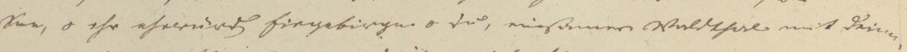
See, & ihr ehrwürdigen Eisgebirge & Du, einsames Waldthal mit Deinem
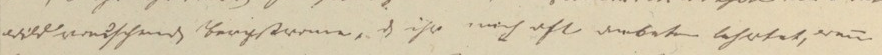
wild rauschenden Bergstrome, die ihr mich oft anbeten lehrtet, wenn
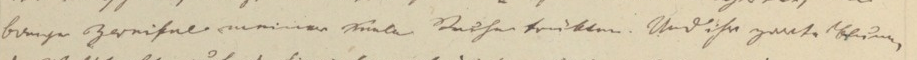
bange Zweifel meiner Seele Ruhe trübten. Und ihr zarte Blumen
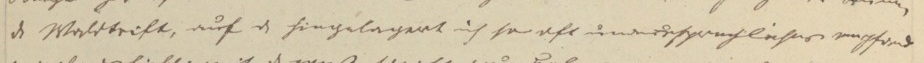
der Waldtrift, auf die hingelagert ich so oft unaussprechliches empfand
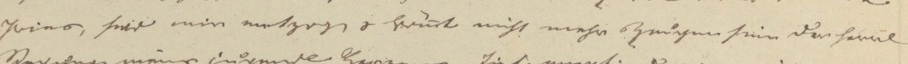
pries, seid mir entzogen & könnt nicht mehr Zeugen sein der herrl.
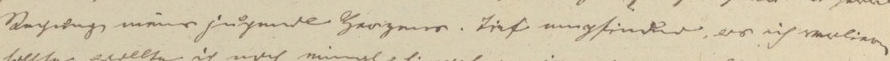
Regungen meines jugendl. Herzens. Tief empfindend, ws ich verlieren
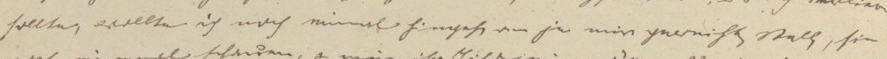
sollte, wollte ich noch einmal hingehen an je mir geweihte Stellen, sie
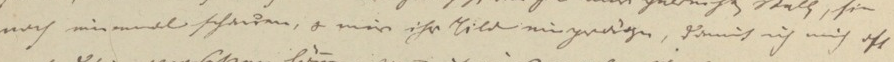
noch einmal schauen, & mir ihr Bild einprägen, damit ich mich oft
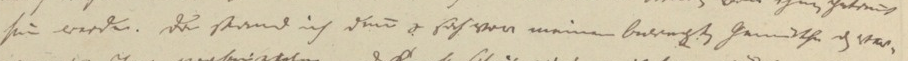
sein werde. Da stand ich denn & sah vor meinem bewegten Gemüthe die ver-
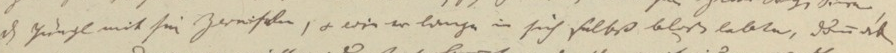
den Jüngl. mit sein. Zweifeln, & wie er lange in sich selbst bloß lebte, dann aber
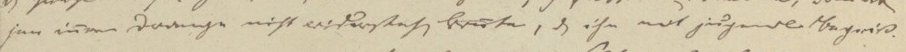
jen. innren Drange nicht widerstehen konnte, der ihn mit jugendl. Begeist.
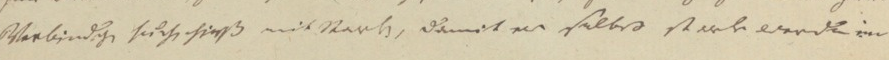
Verbindungen suchen hieß mit Starken, damit er selbst stark werde im
